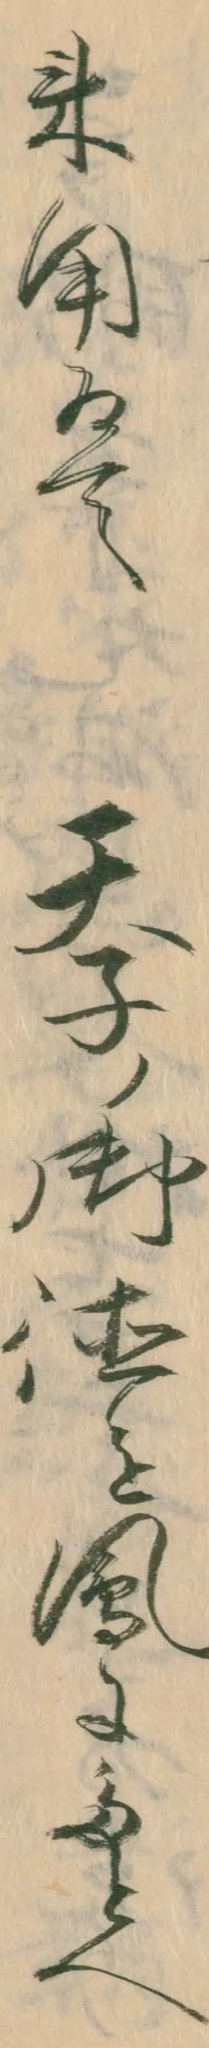来用ゐて天子の御徳を鳳にたとへ
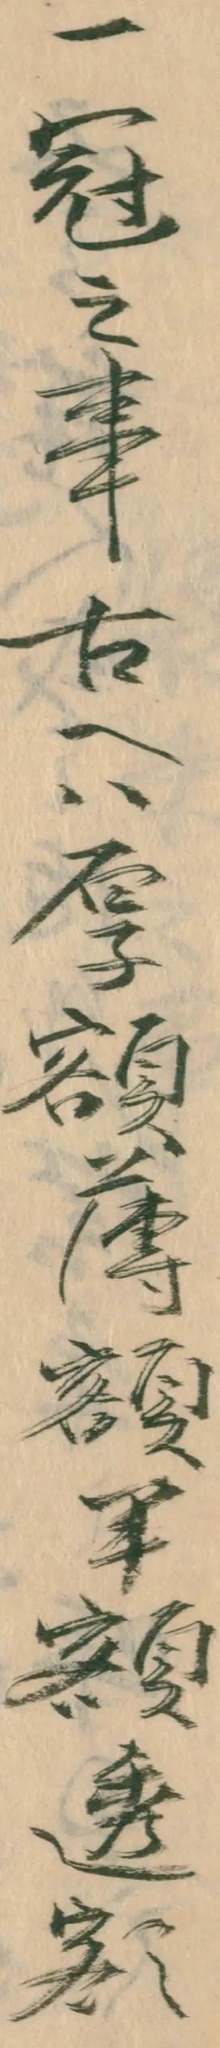一冠之事古へは厚額薄額半額透額
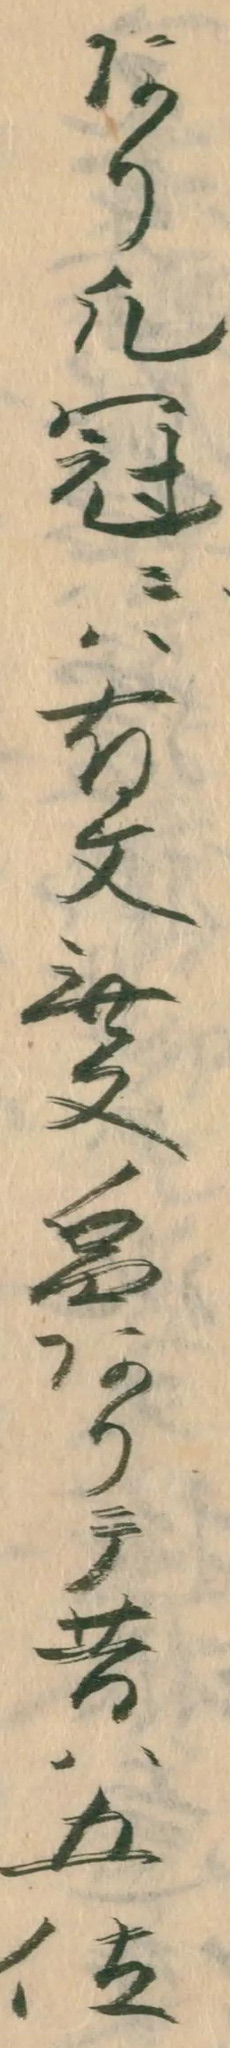あり凡冠には有文無文の品ありて昔は五位
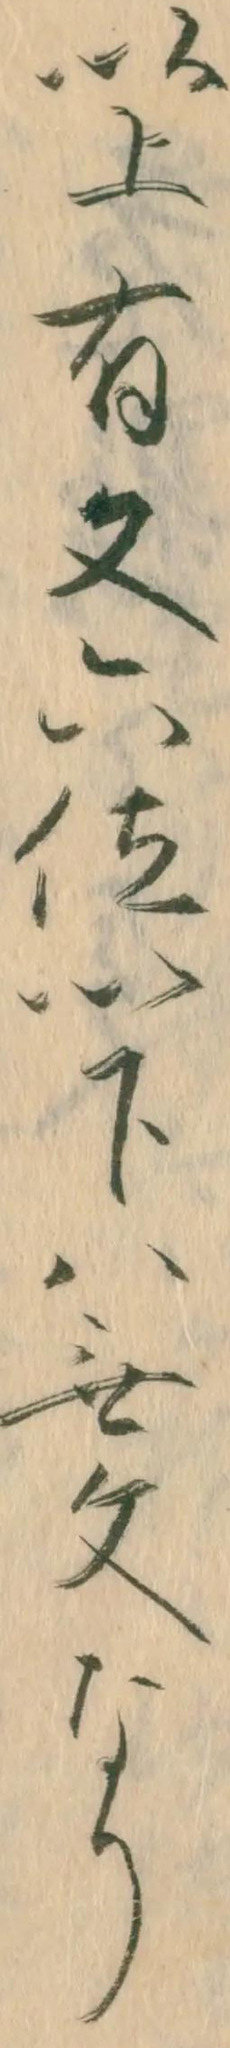以上有文六位以下は無文なり
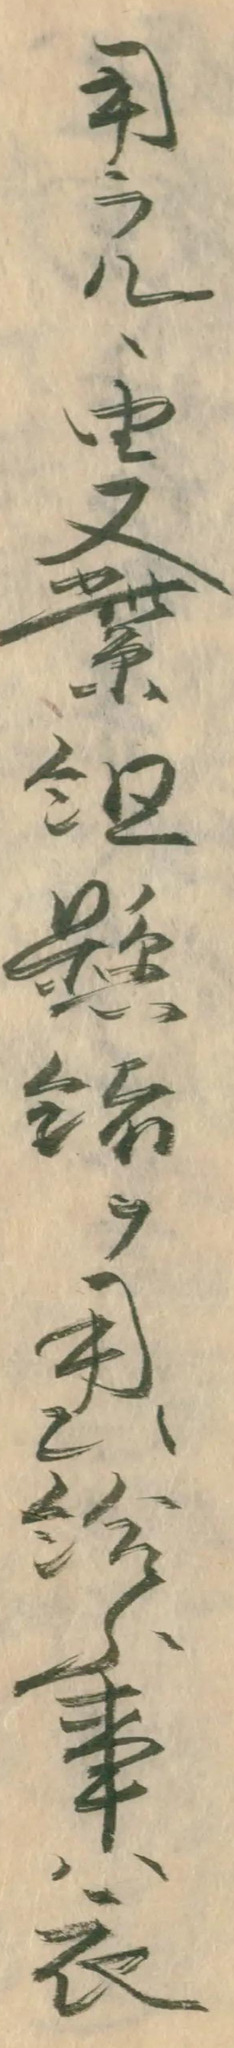用らるゝ由又紫組懸緒を用ひ給ふ事は衣
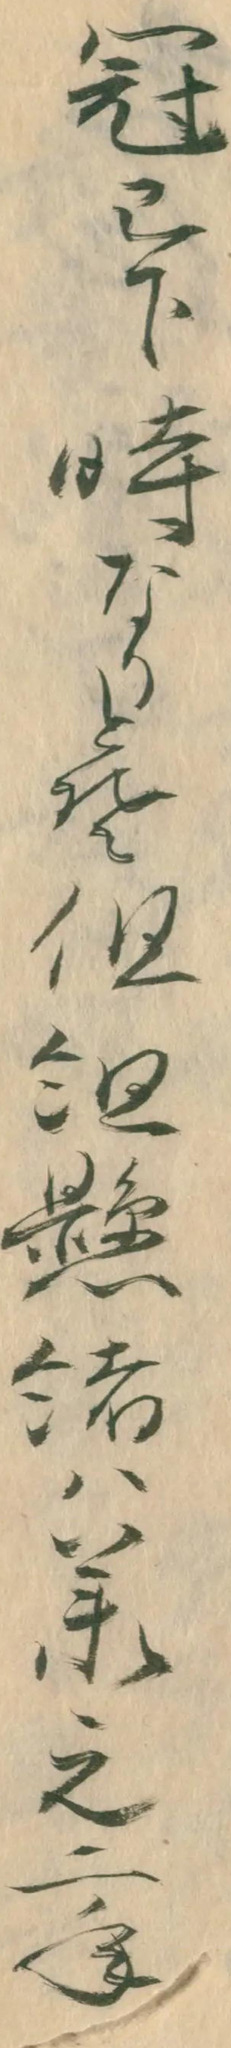冠已下時なりとそ但組懸緒は承元二年
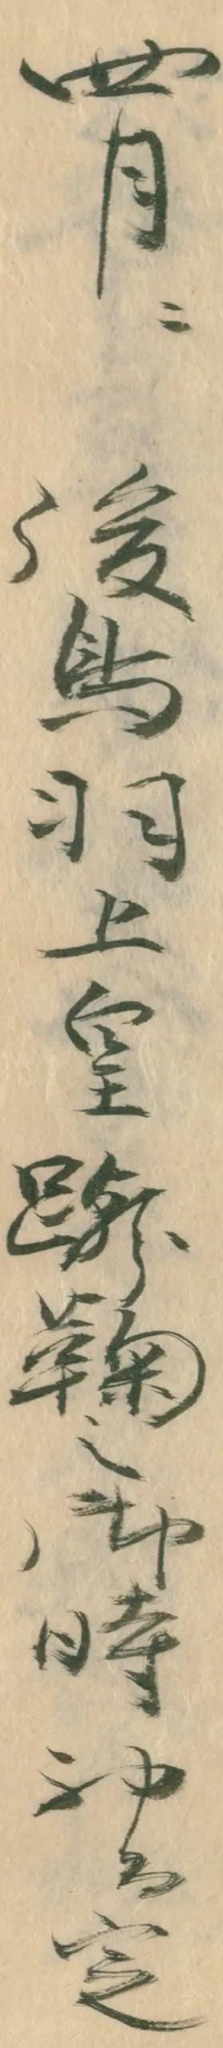四月に後鳥羽上皇蹴鞠之御時初而定

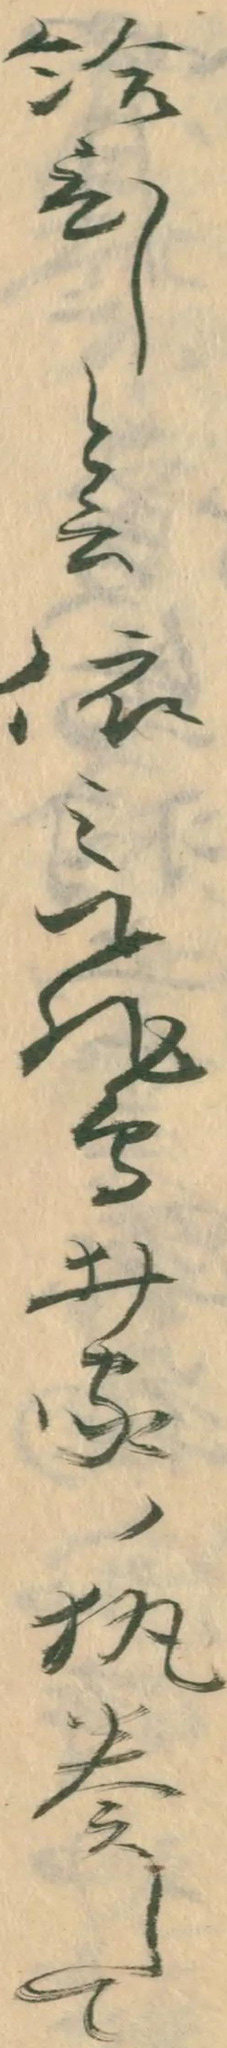給ひしと云依之飛鳥井家の執奏して
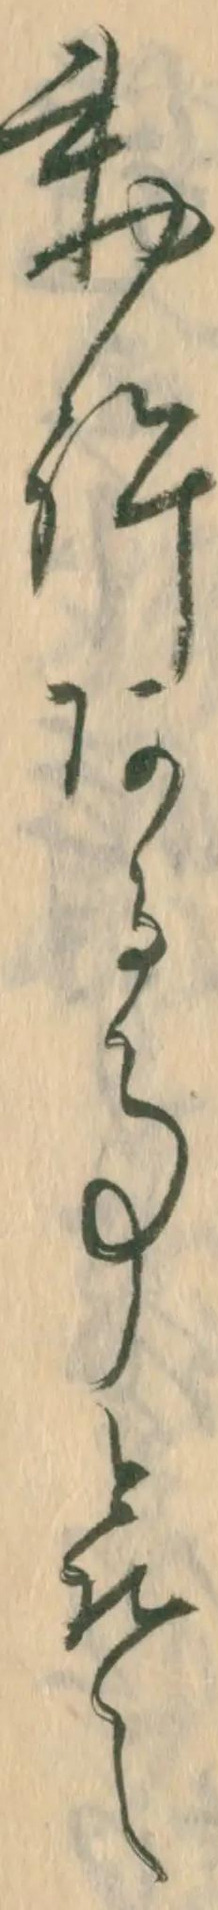勅許ある事とそ
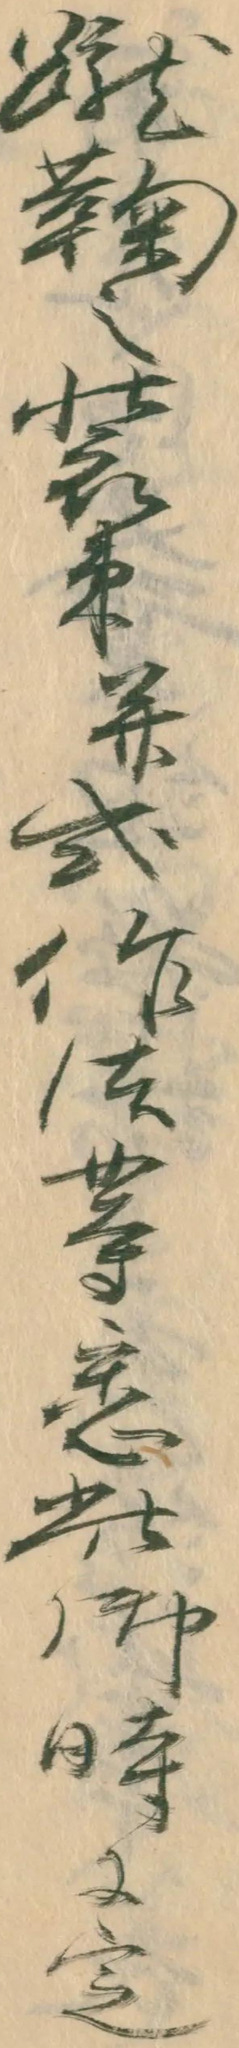蹴鞠之装束幷式作法等悉此御時に定
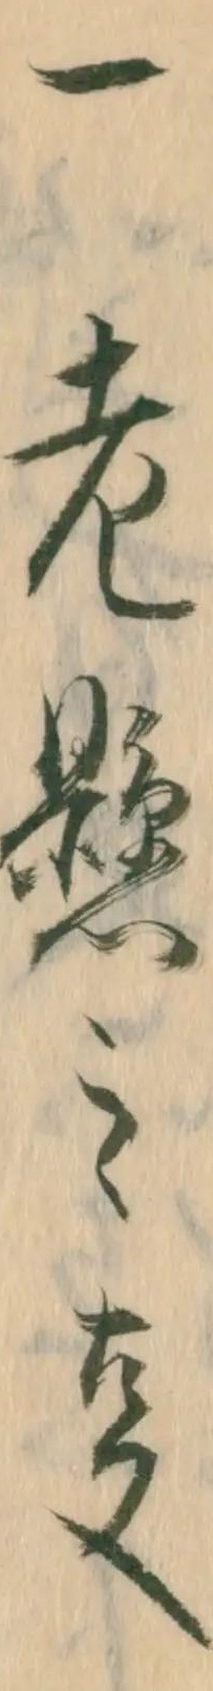一老懸之事
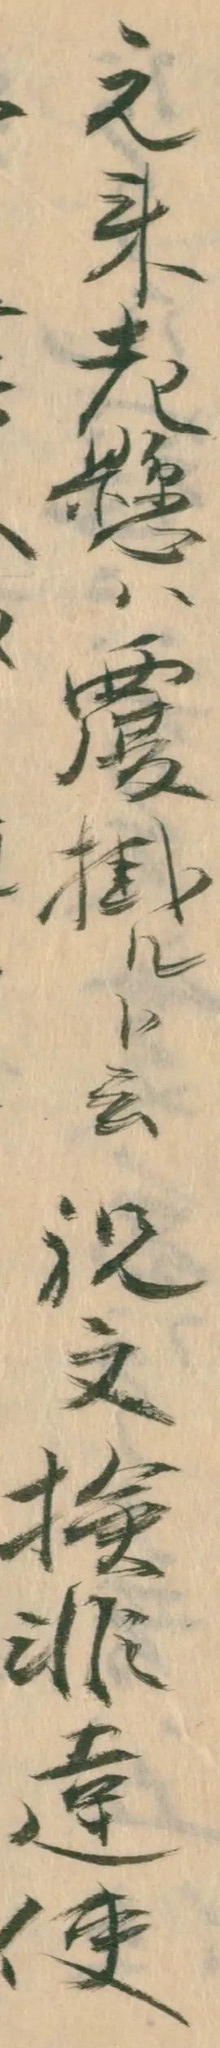元来老懸は覆掛ると云祝文検非違使
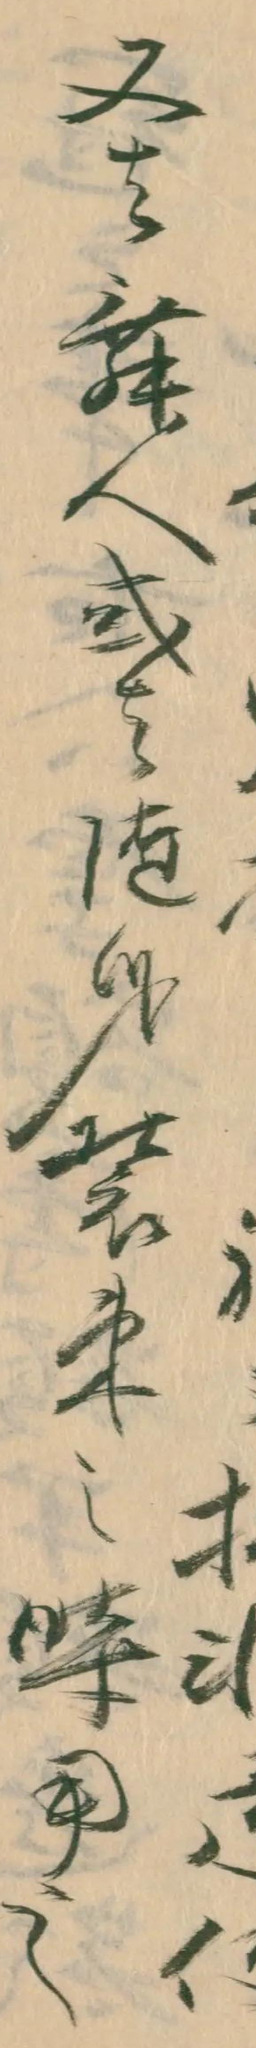又は舞人或は随身装束之時用也
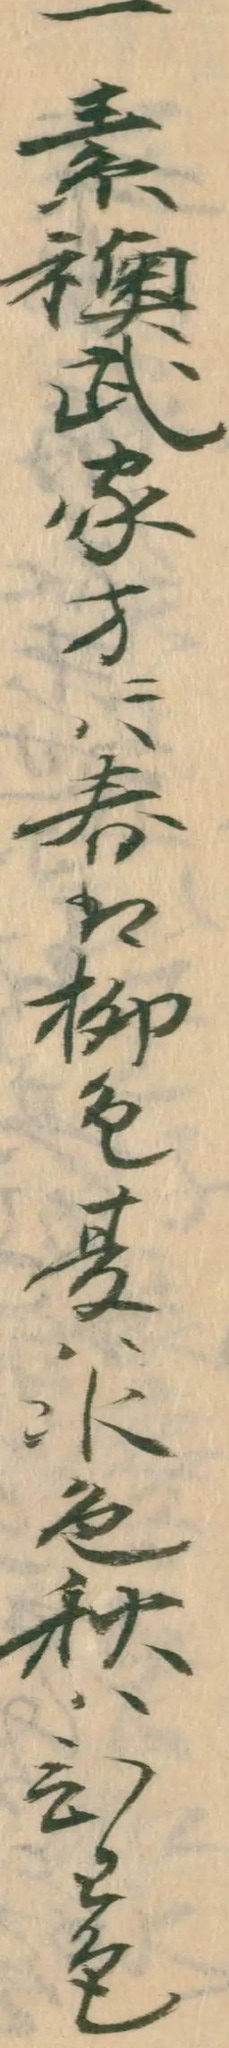一素襖武家方には春は柳色夏は水色秋はひわ色
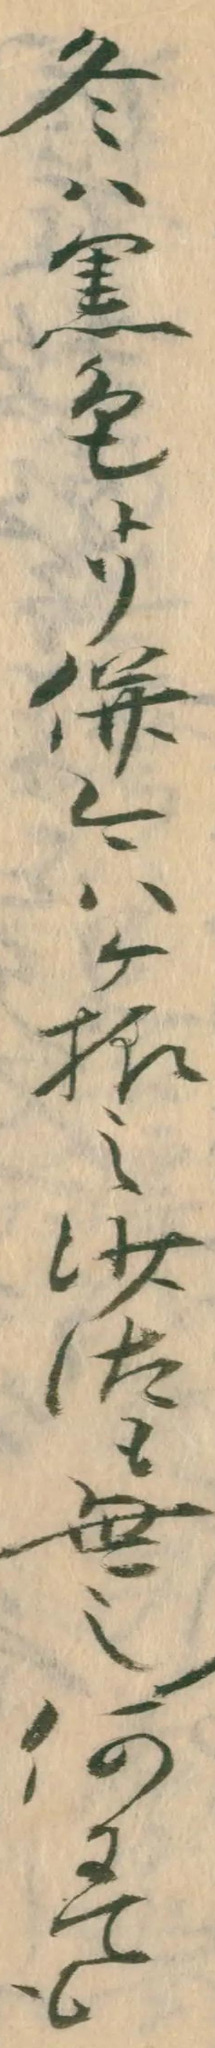冬は黒色とり併今はけ様之沙汰も無也何にても
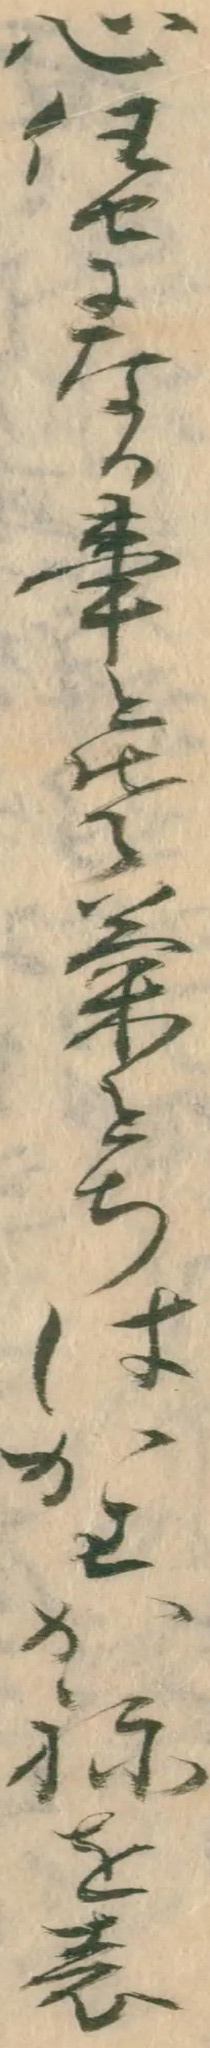心任せになる事とそ菊とちはかわかねを表
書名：賀茂社記録. 第12冊
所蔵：国立国会図書館 National Diet Library, JAPAN
